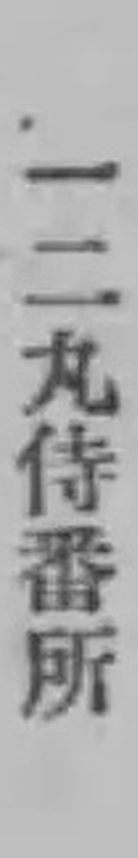一二丸侍番所

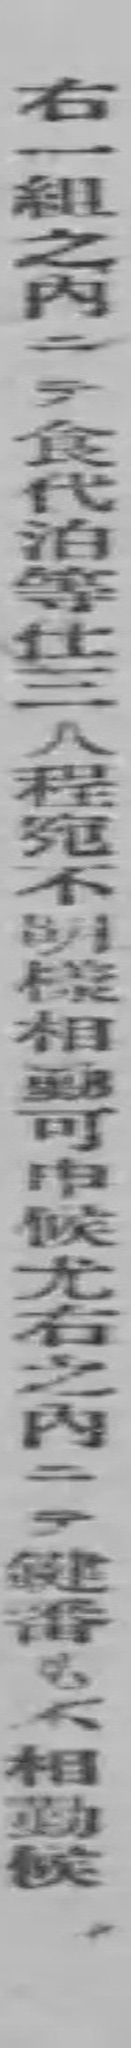右一組之事内ニテ食代泊等仕三人程宛不明様相勤可申候尤右之内ニテ鍵番も不相勤候
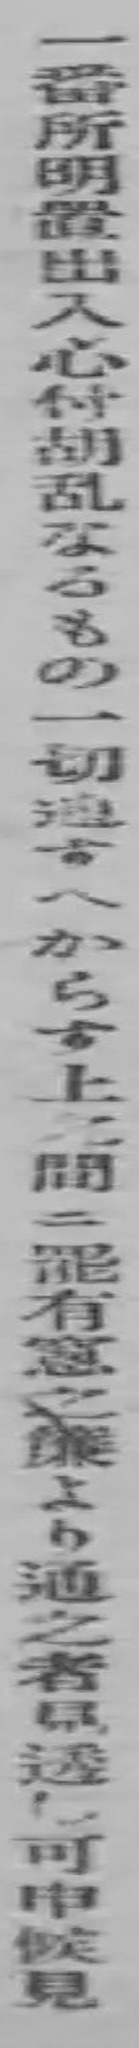一番所明置出入心付胡乱なるもの一切通すへからす上之間ニ罷有窓之簾より通之者見透し可申候見
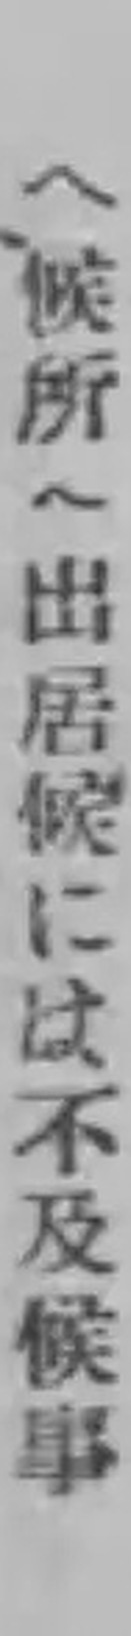へ候所へ出居候には不及候事
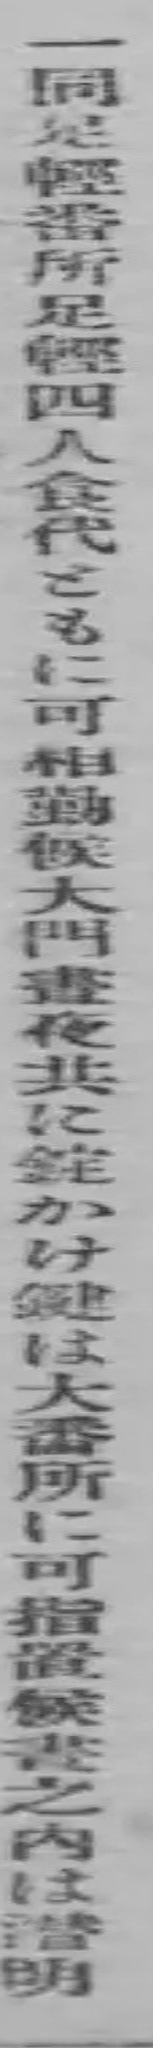一同足軽番所足軽四人食代ともに可相勤候大門昼夜共に錠かけ鍵は大番所に可指置候昼之内は潜明
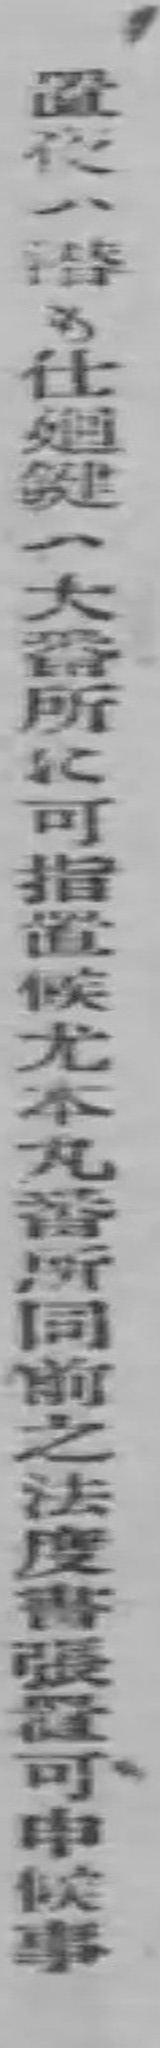置夜は潜も仕廻鍵は大番所に可指置候尤本丸番所同前之法度書張置可申候事
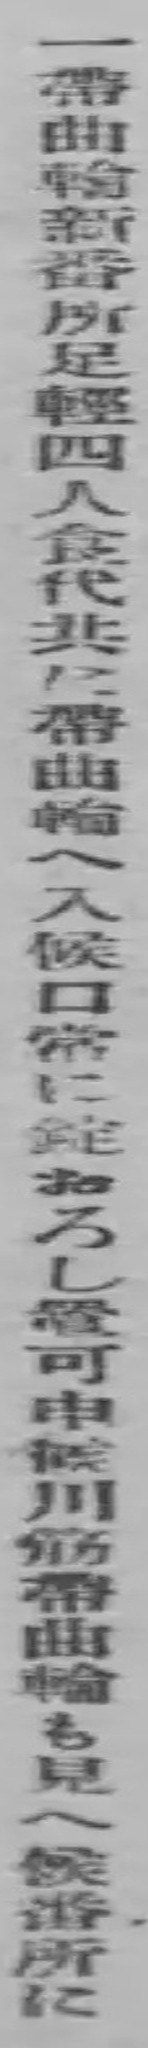一帯曲輪新番所足軽四人食代共に帯曲輪へ入候口常に錠おろし置可申候川筋帯曲輪も見へ候番所に
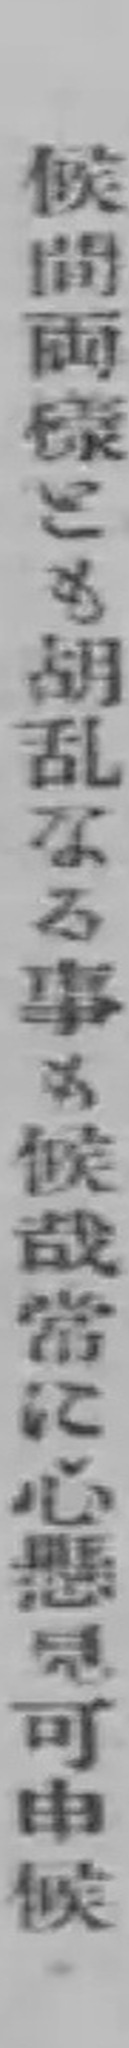候間両様とも胡乱なる事も候哉常に心懸見可申候
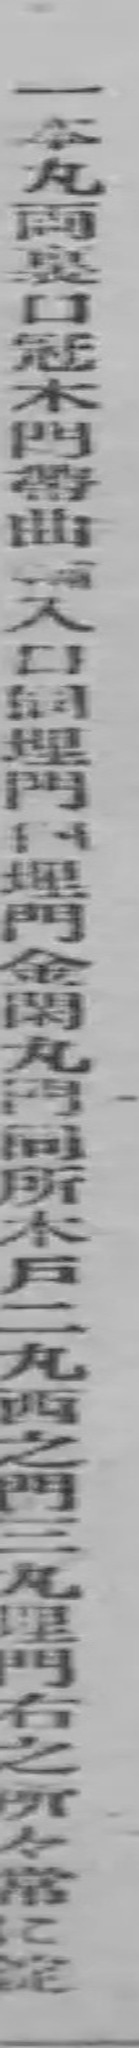一本丸両裏口冠木門帯曲輪入口同埋門同埋門金閑丸門同所木戸二丸西之門三丸埋門右之所々常に錠
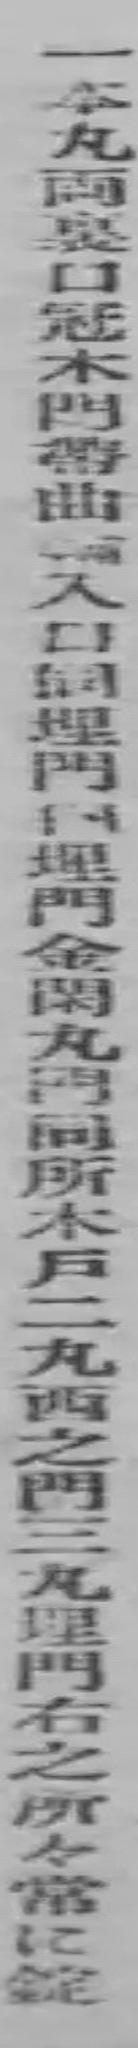一本丸両裏口冠木門帯曲輪入口同埋門同埋門金閑丸門同所木戸二丸西之門三丸埋門右之所々常に錠
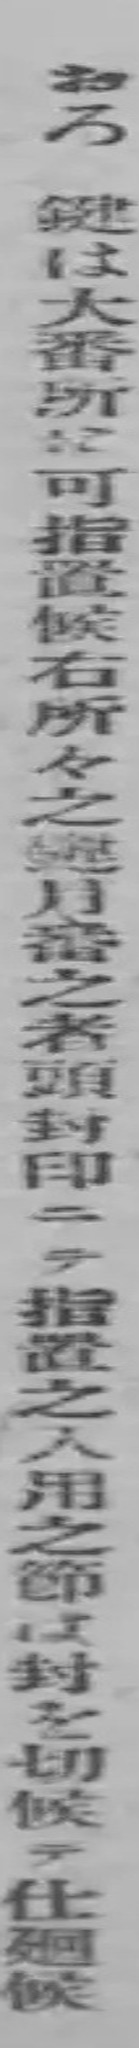おろし鍵は大番所に可指置候右所々之鍵月番之者頭封印ニテ指置之入用之節は封を切候テ仕廻候
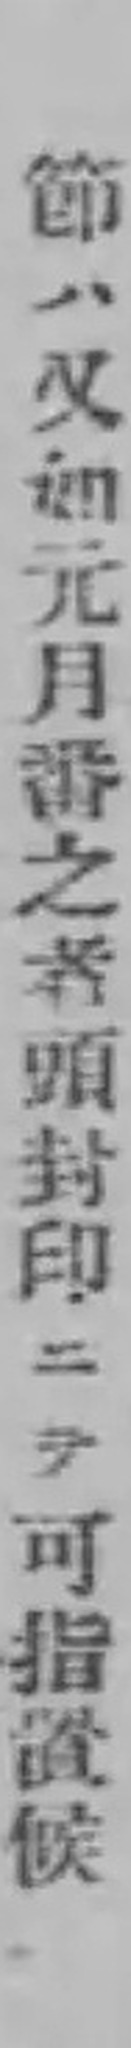節は又如元月番之者頭封印ニテ可指置候
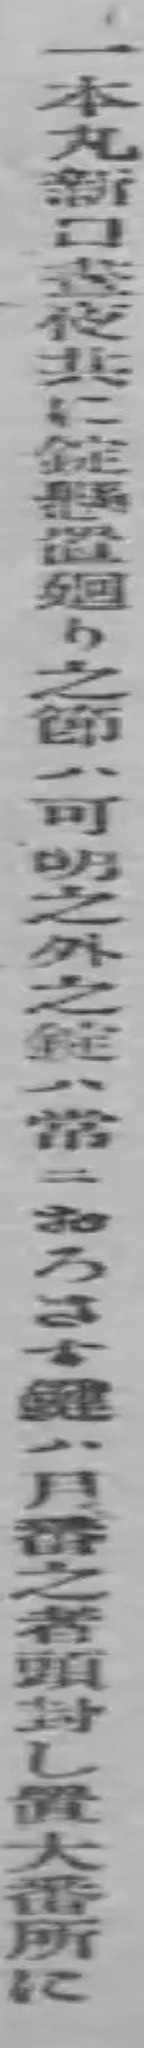一本丸新口昼夜共に錠懸置廻り之節は可明之外之錠は常ニおろさす鍵は月番之者頭封し置大番所に
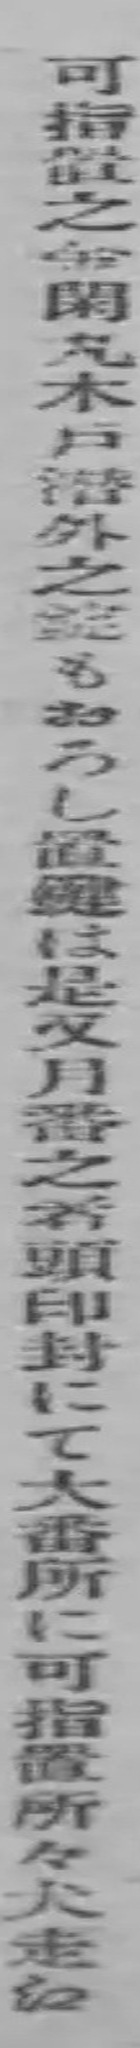可指置之金閑丸木戸潜外之錠もおろし置鍵は是又月番之者頭印封にて大番所に可指置所々犬走え
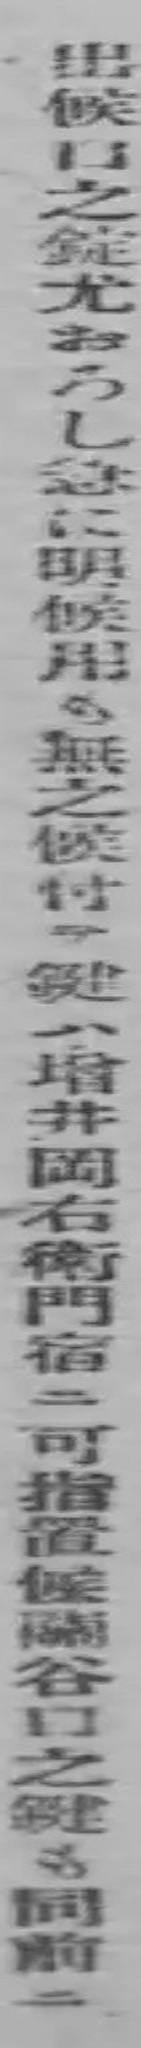出候口之錠尤おろし急に明候用も無之候付テ鍵は増井岡右衛門宿ニ可指置候関谷口之鍵も同前ニ
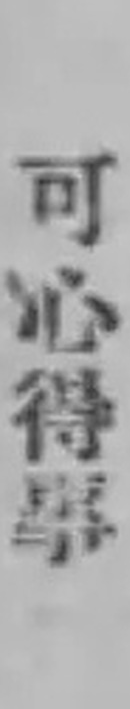可心得候
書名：豊橋市史談
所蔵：国立国会図書館 National Diet Library, JAPAN
